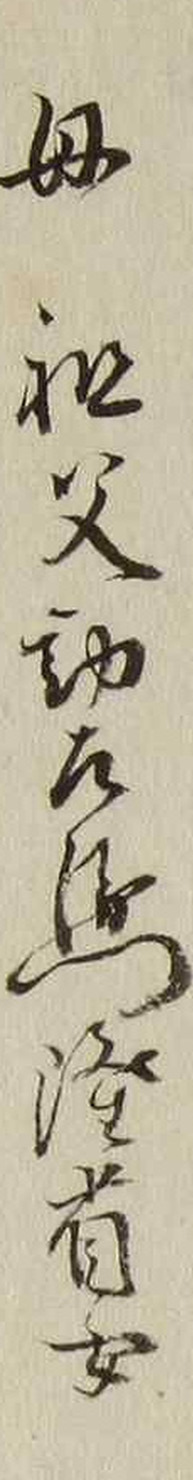母祖父勤左衛門隆省女
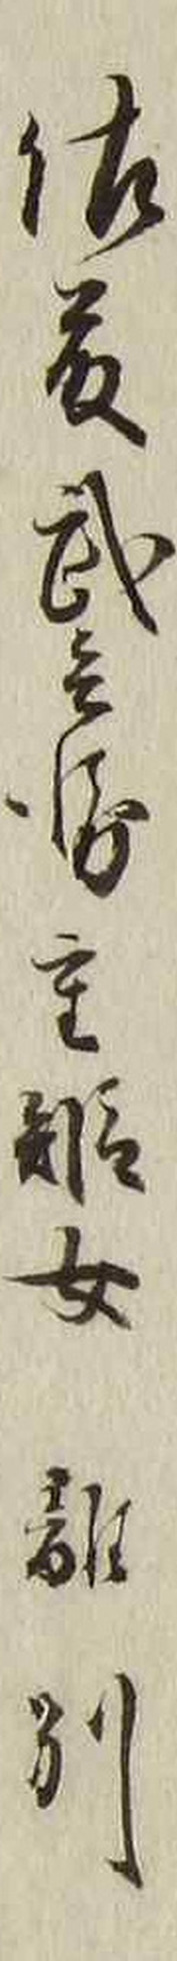佐藤武兵衛重矩女離別

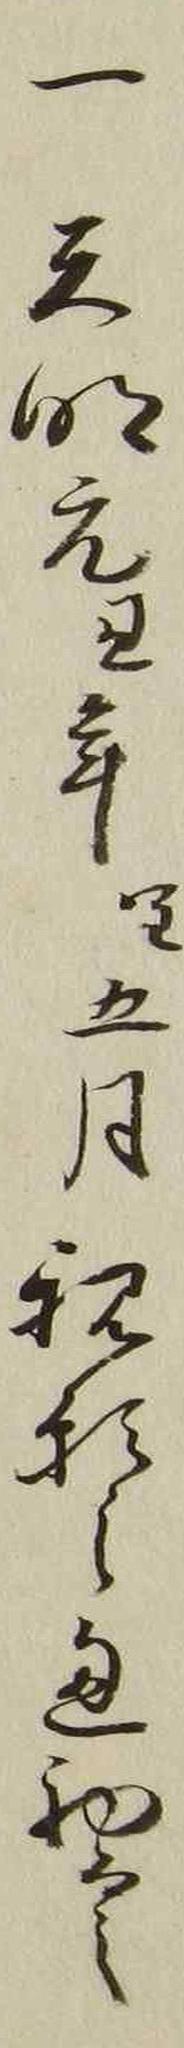一天明元丑年閏五月親願之通初而之
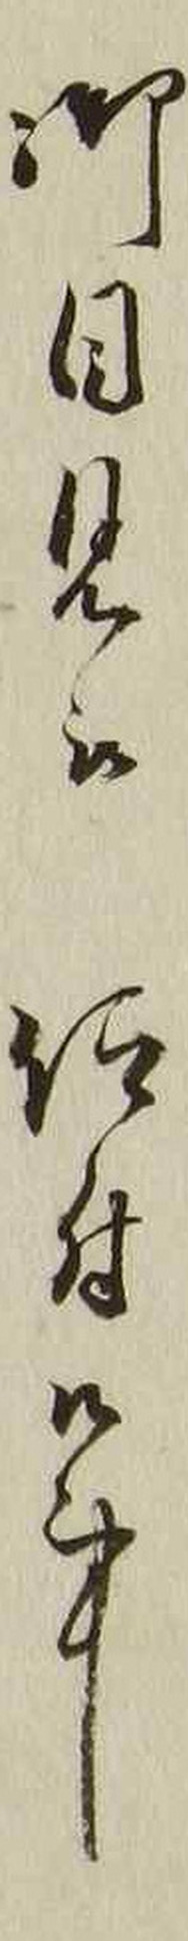御目見被仰付候事
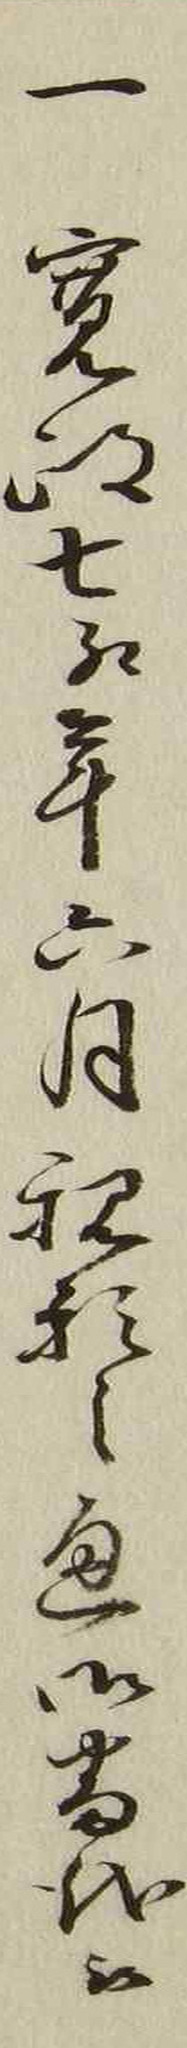一寛政七卯年六月親願之通御番代被
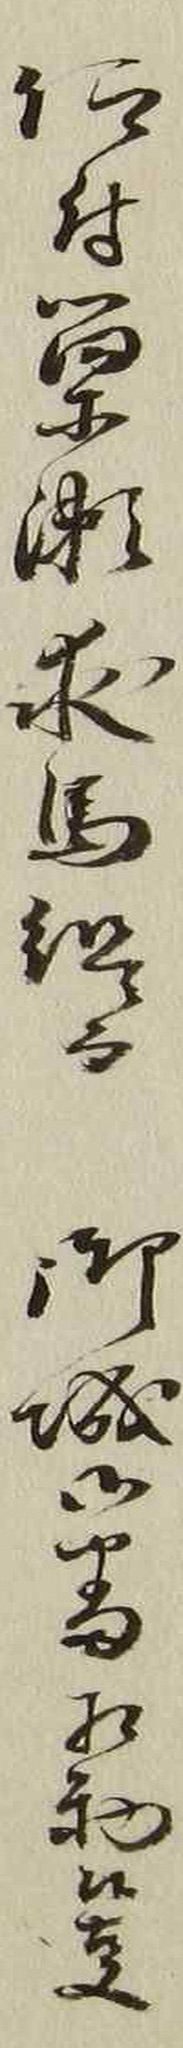仰付簗瀬求馬組ニ而御城御番相勤候事
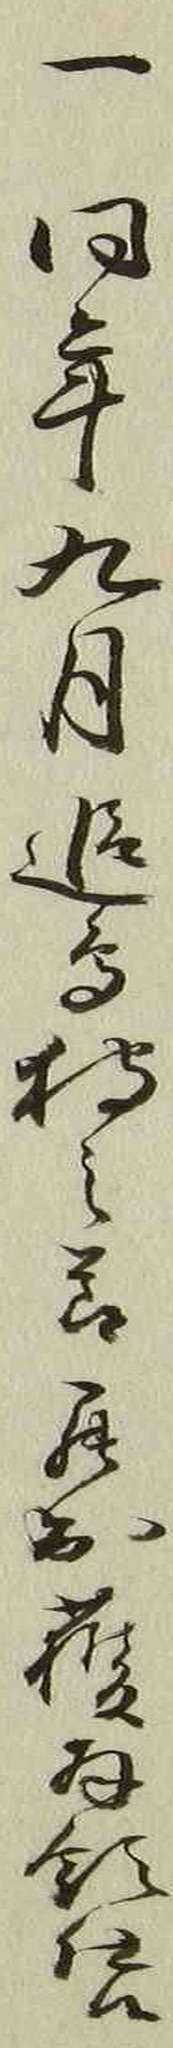一同年九月追鳥狩之節罷出獲拝領仕候
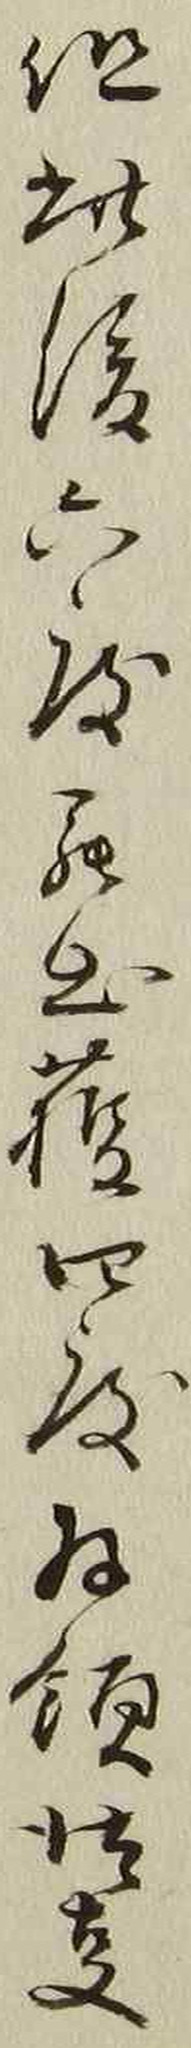但此後六度罷出獲四度拝領仕候事
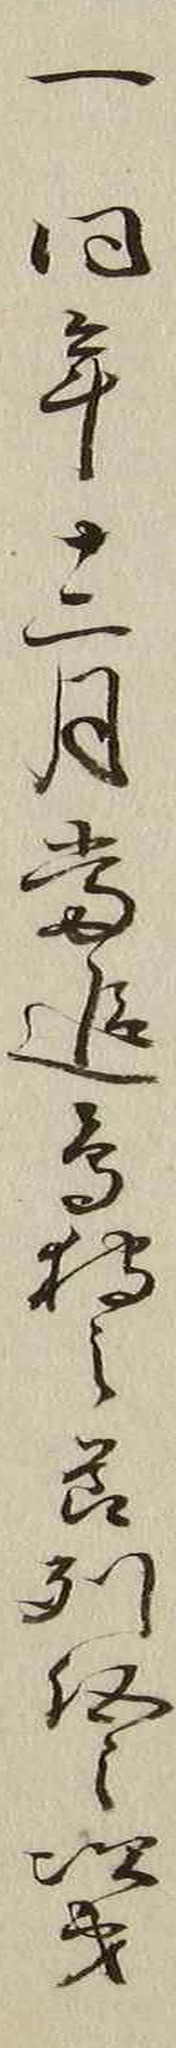一同年十二月当追鳥狩之節列伍之次第
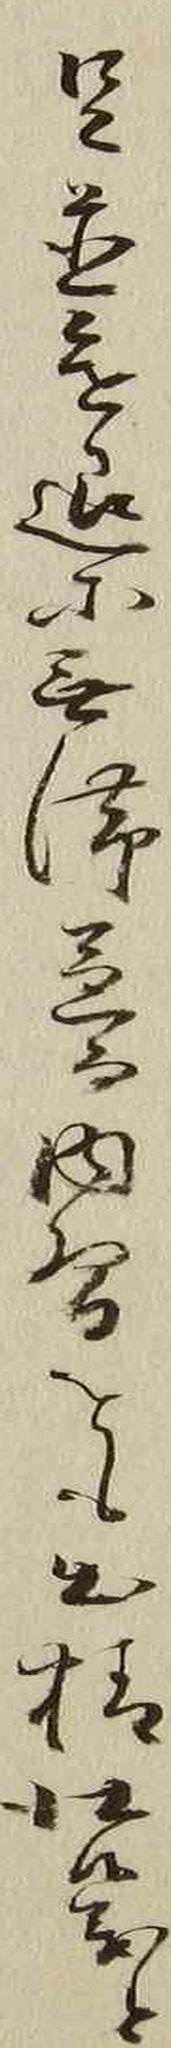足並進退等無滞兼而内習をも出精仕候義と
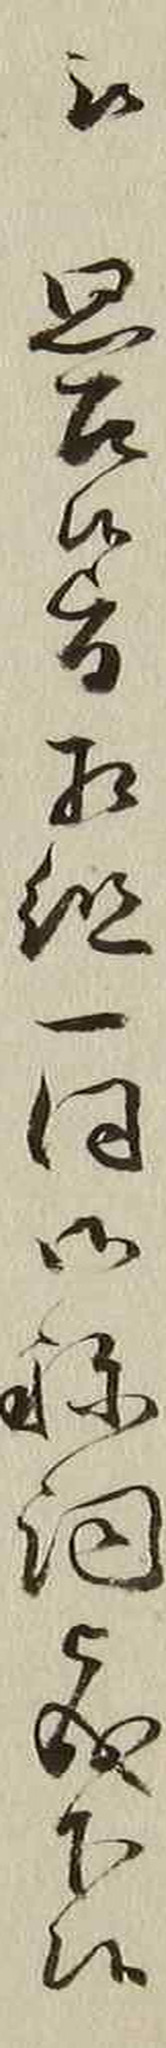被思召候旨相組一同御称詞被成下候
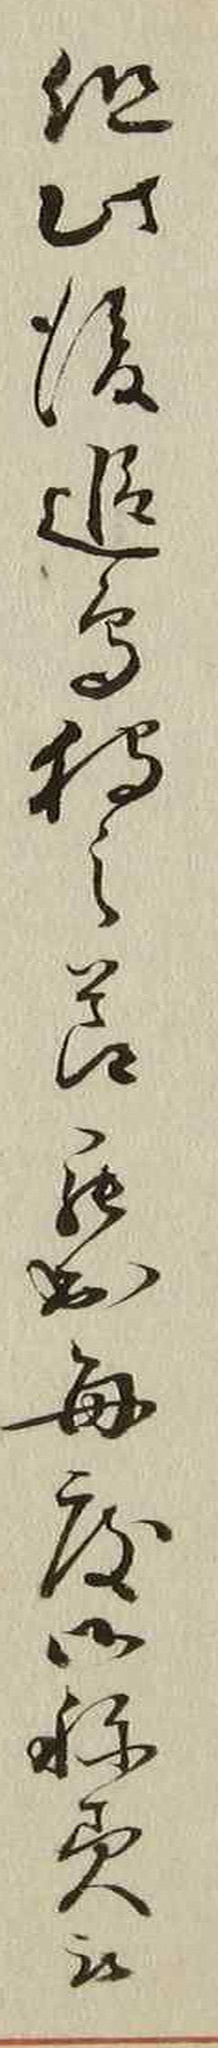但此後追鳥狩之節罷出毎度御称美被
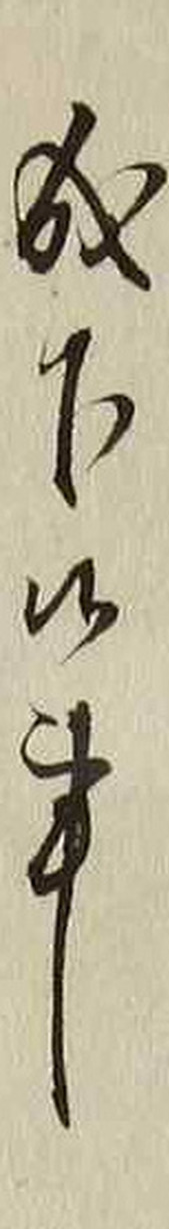成下候事
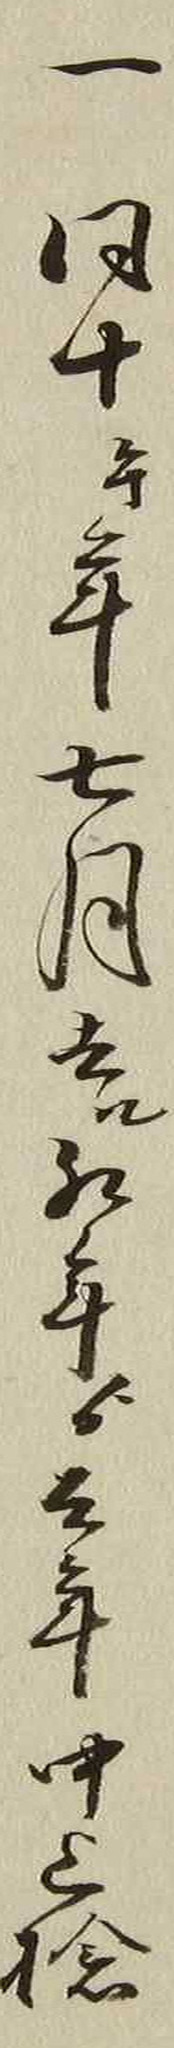一同十午年七月去ル卯年ゟ去年中迄槍
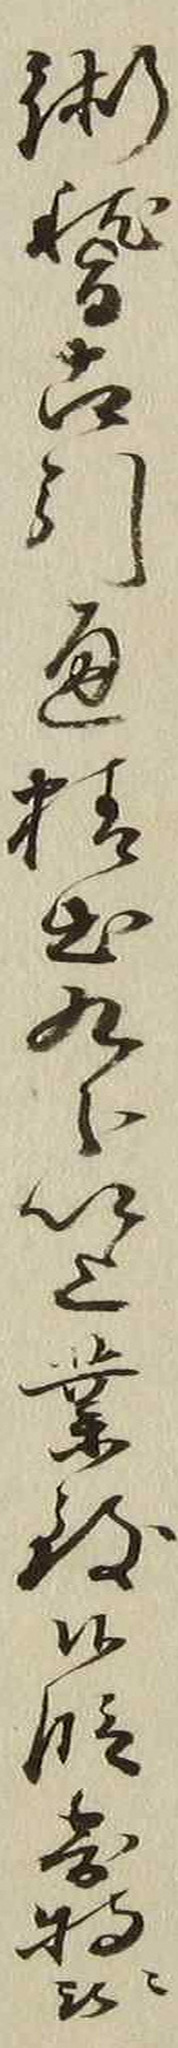術稽古引通精出九分以上業致候段奇特ニ被
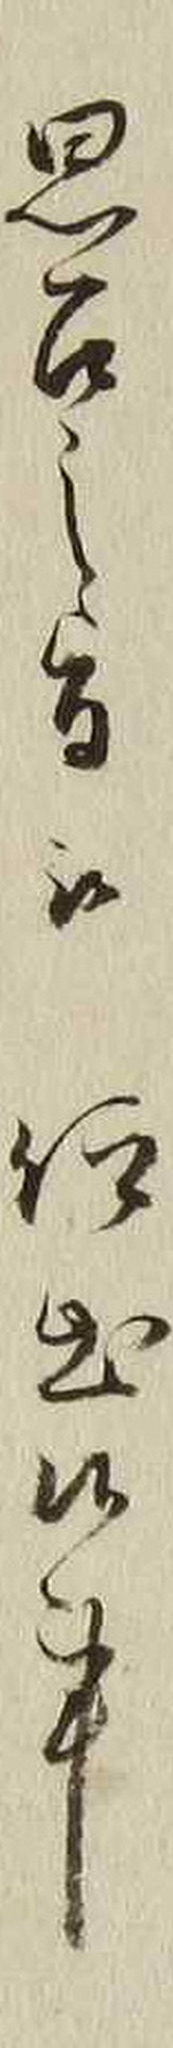思召之旨被仰出候事
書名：諸士系譜　巻之26　い之部26
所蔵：会津若松市立会津図書館
